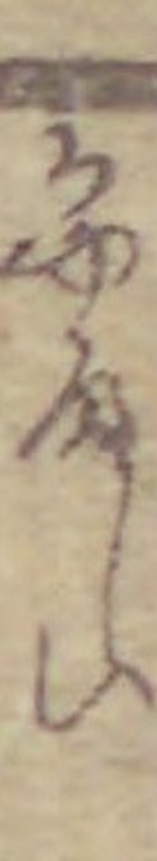かやましい
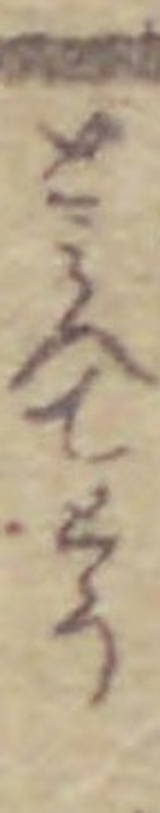とみへてとう
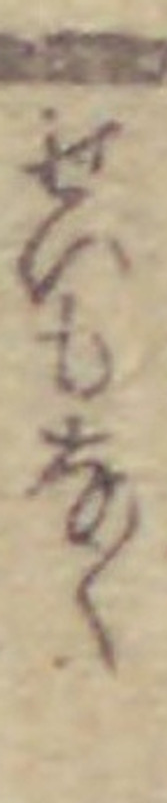せいもなく
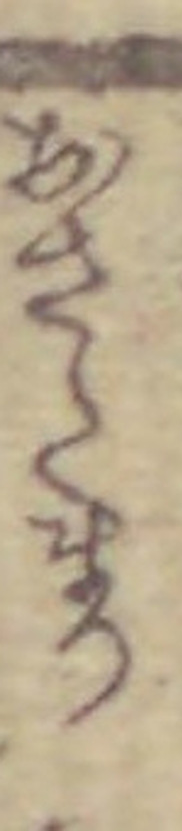おさたまり
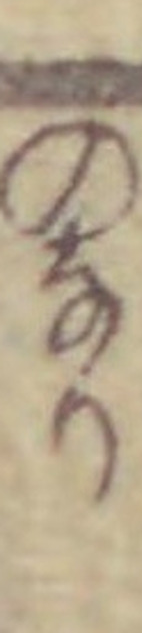のなり
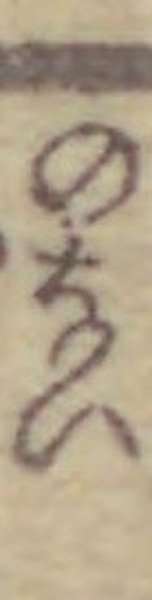のなり
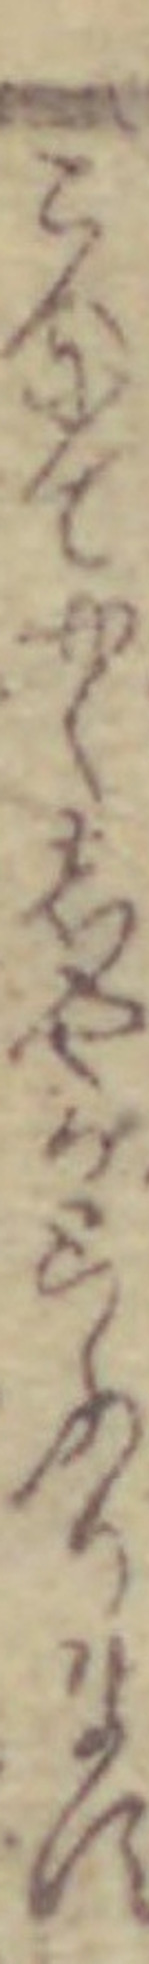こへにてやくしやかとふります
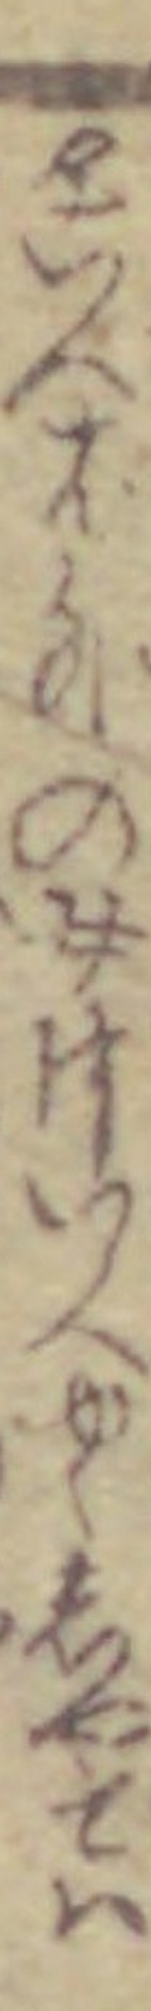といへは外の女中いへやくしやては
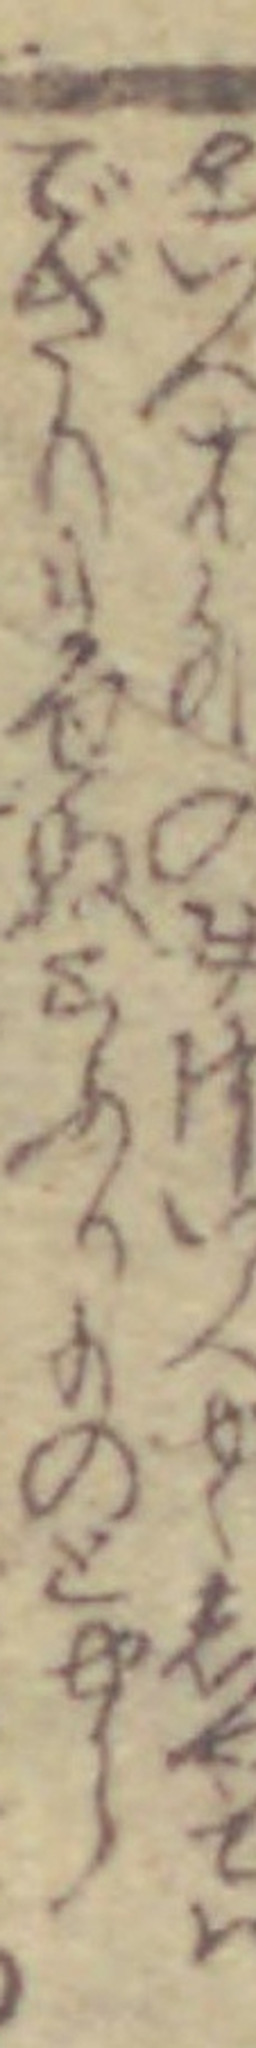ござりませぬとふりものとやら
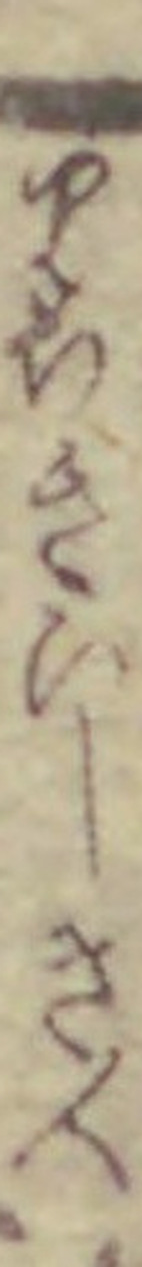りちきらしき人
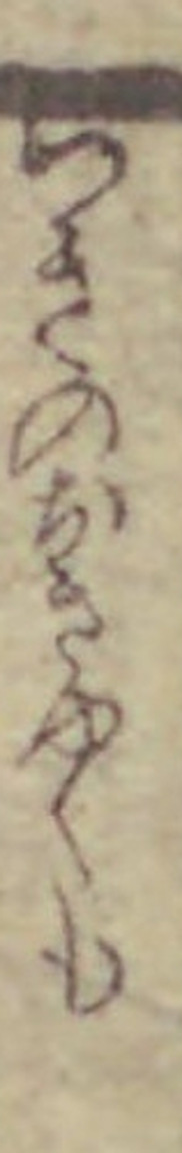つきのおきやくも
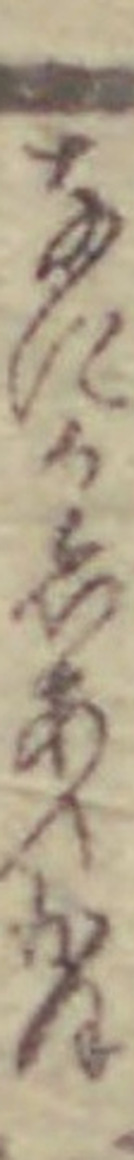なにかしあんかほ
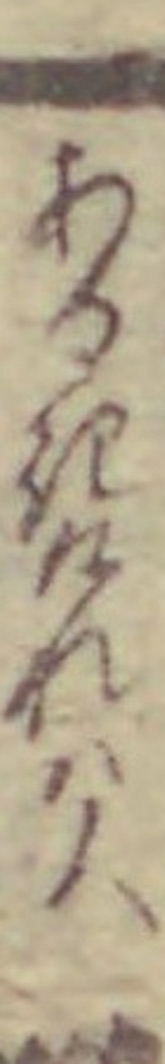あるきけれは人
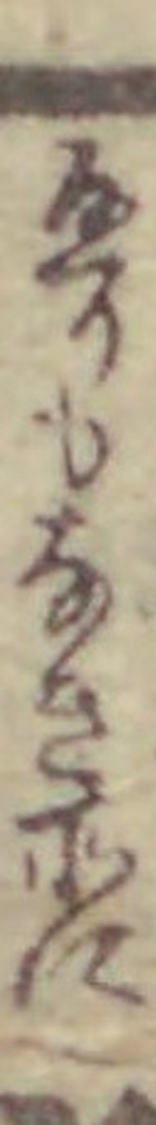通りもなき所に
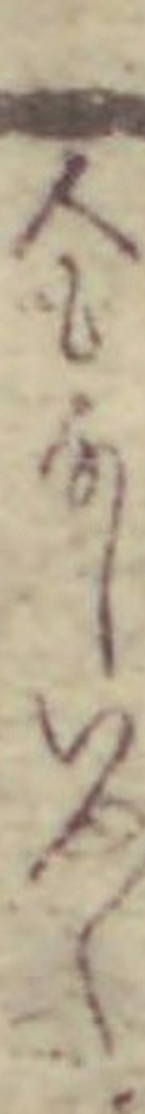人もなしいや〳〵
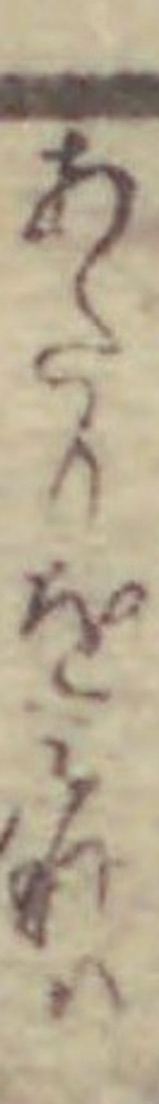あたりをみれは
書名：思事夢濃枕 3巻
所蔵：国立国会図書館 National Diet Library, JAPAN
